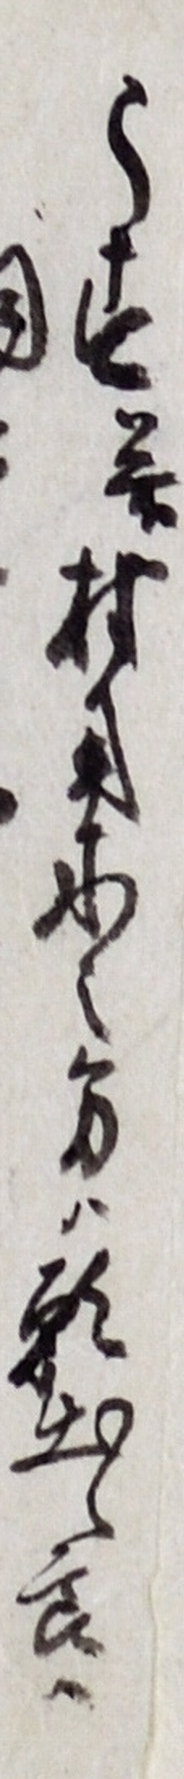うす幷村用木之方ハ願出候節ハ
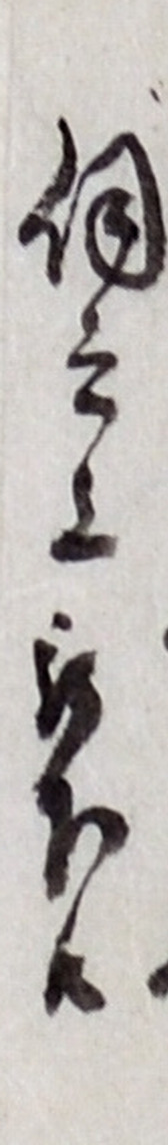伺之上被下候

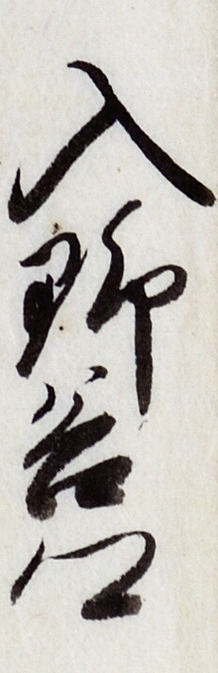入野谷郷
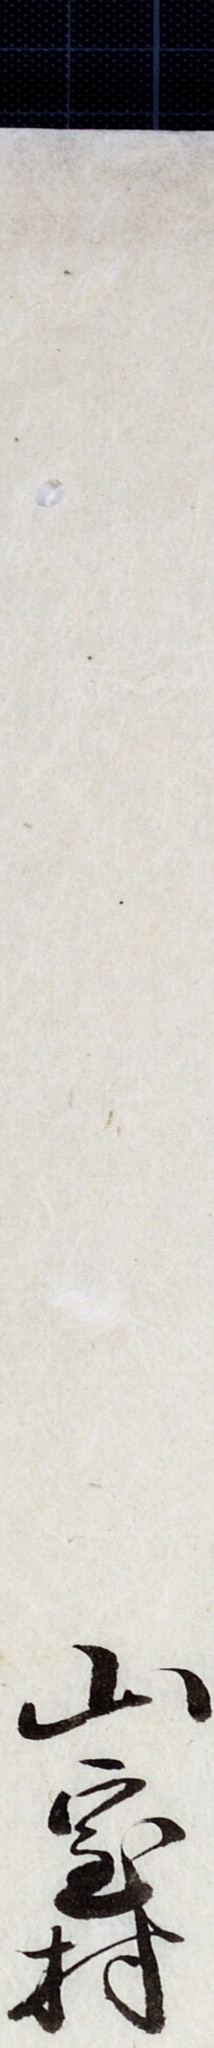山室村
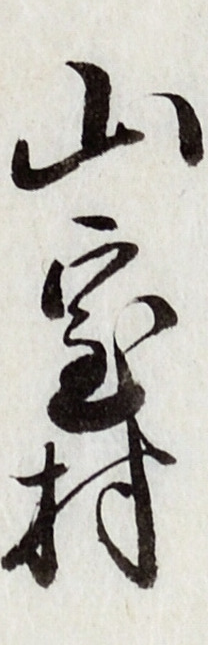山室村
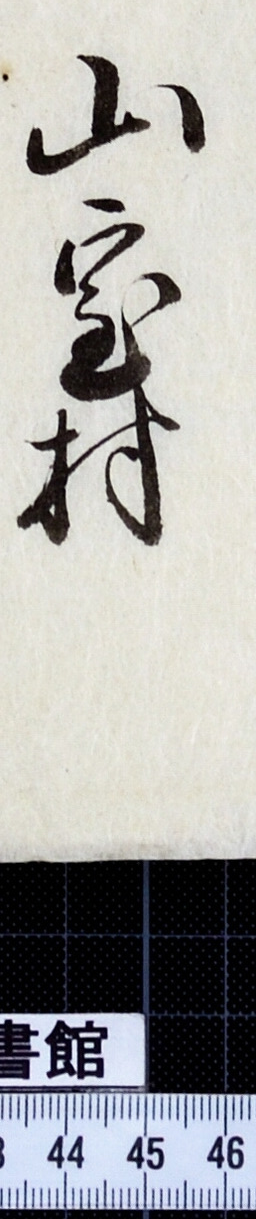山室村
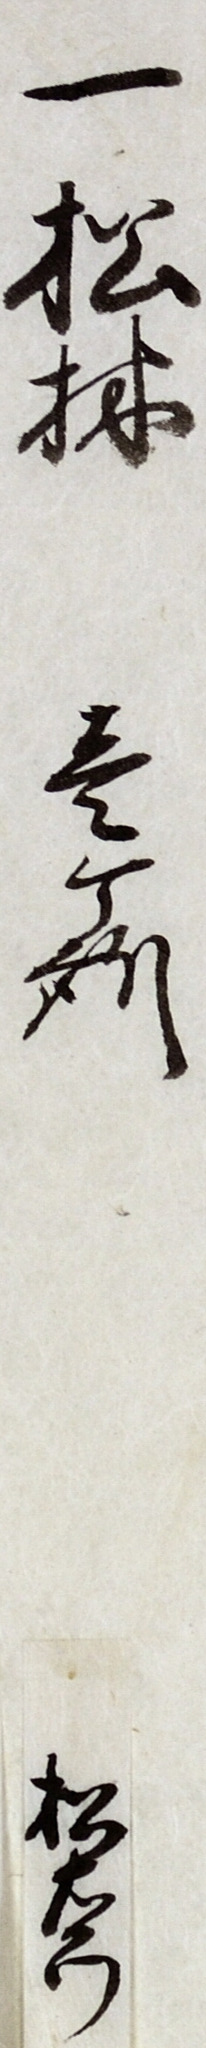一松林壱ケ所松右衛門
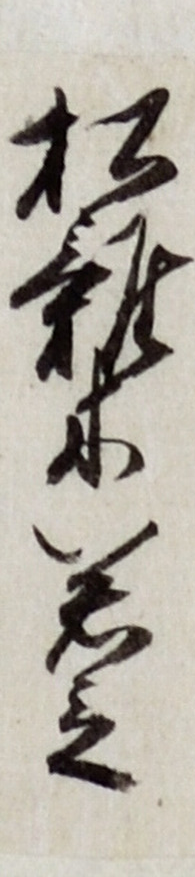松雑木若立
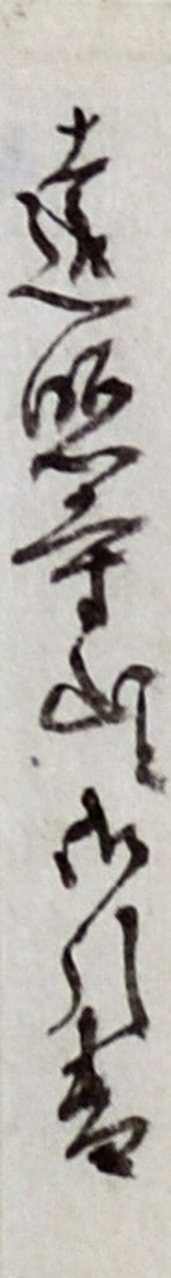遠照寺山ニ御引替

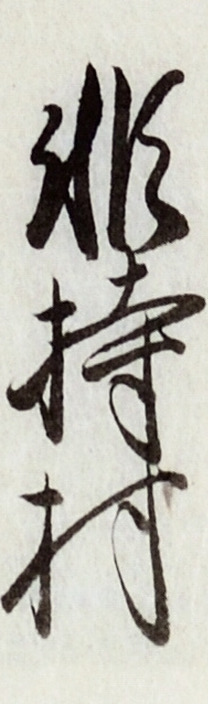非持村
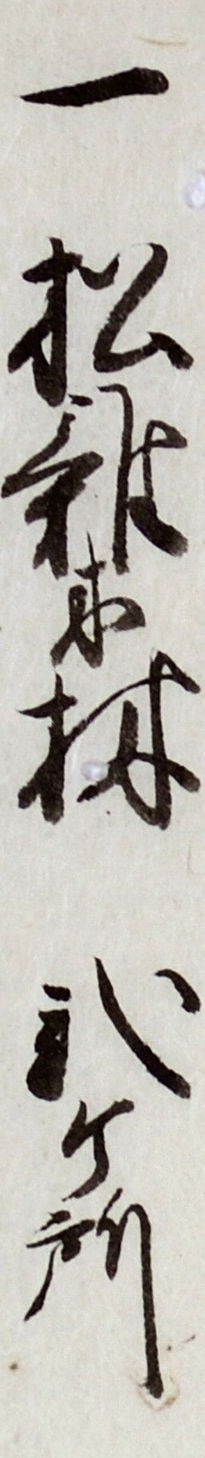一松雑木林弐ケ所
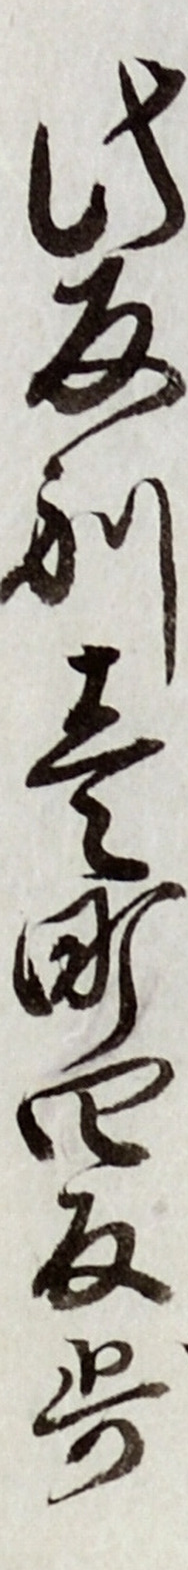此反別壱町四反歩
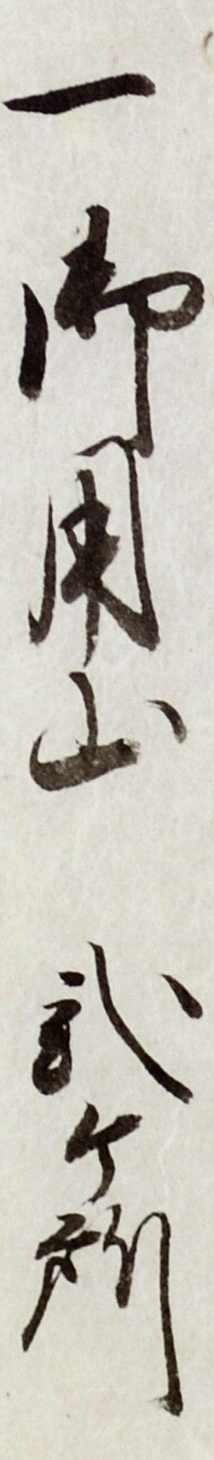一御用山弐ケ所
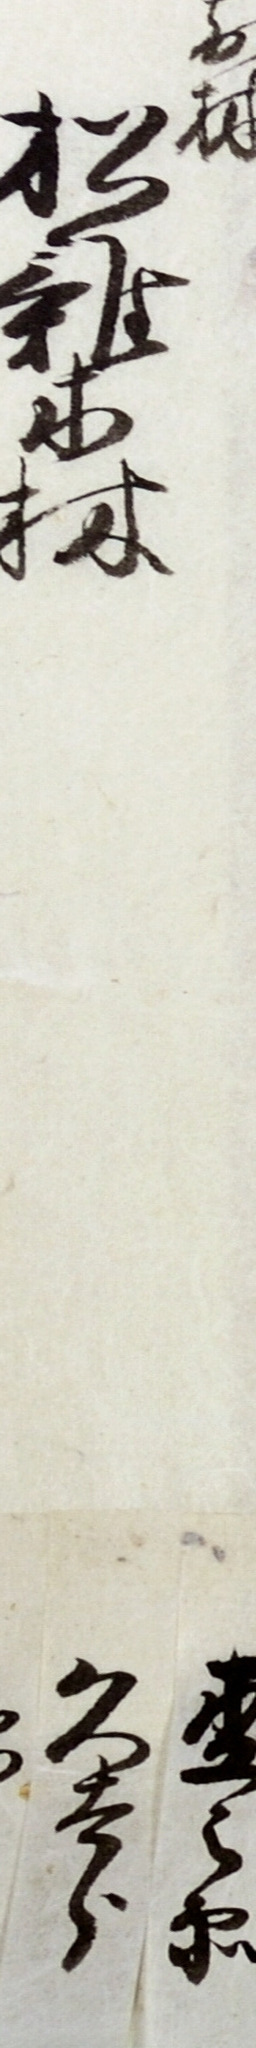松雑木林久太郎
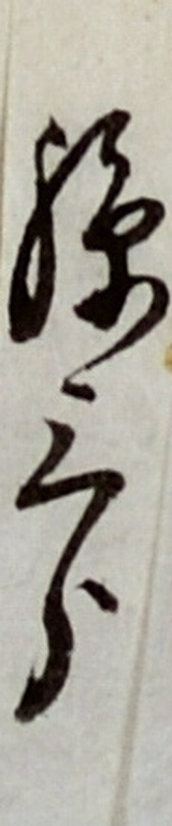孫三郎
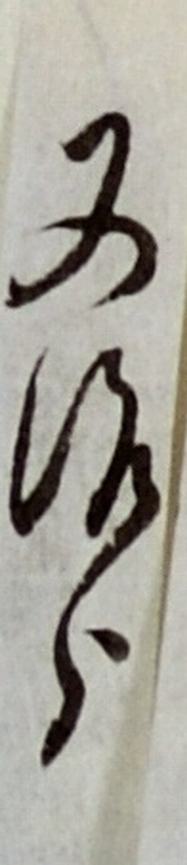又治郎
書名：御領分中御林御藪附帳
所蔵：伊那市立高遠町図書館・合同会社AMANE
